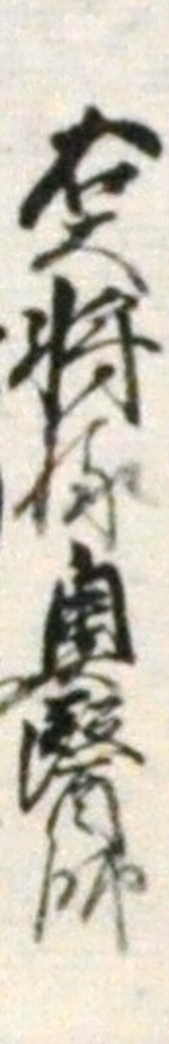右大将様奥医師
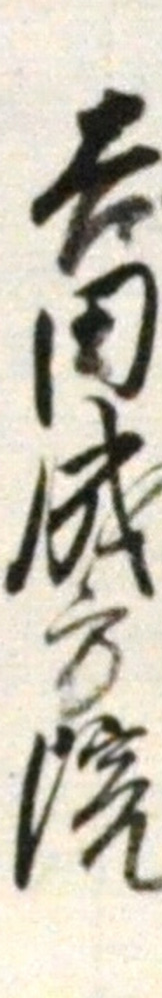吉田成方院
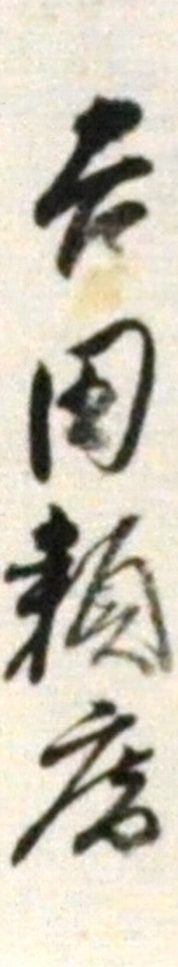吉田頼庵
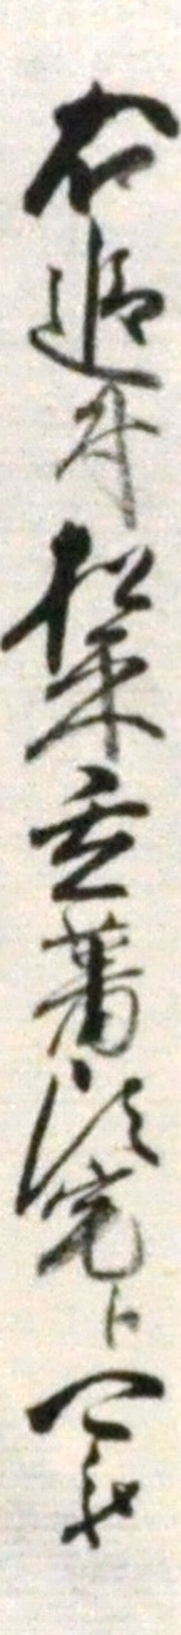右追付松平玄蕃頭宅え可被
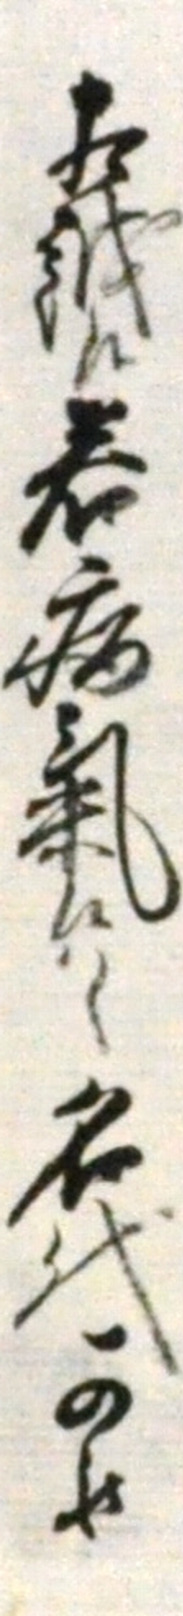相越候若病気候はゝ名代可被
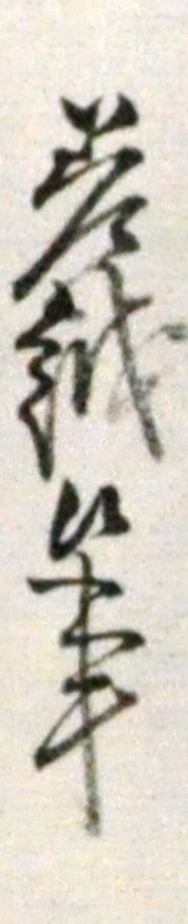差越候事
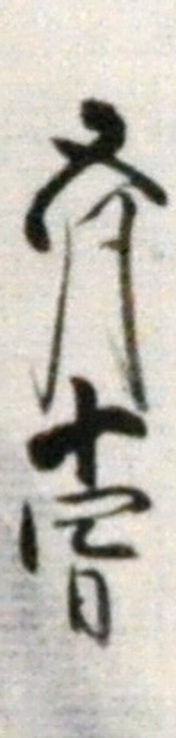五月十四日

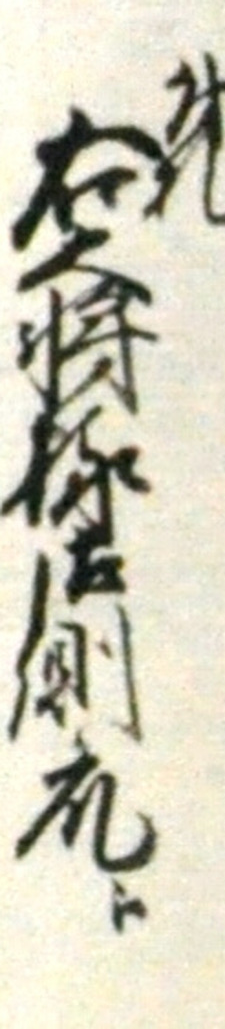右大将様御側衆え
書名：右大将様御側衆へ（控）
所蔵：伊那市立高遠町図書館・合同会社AMANE
